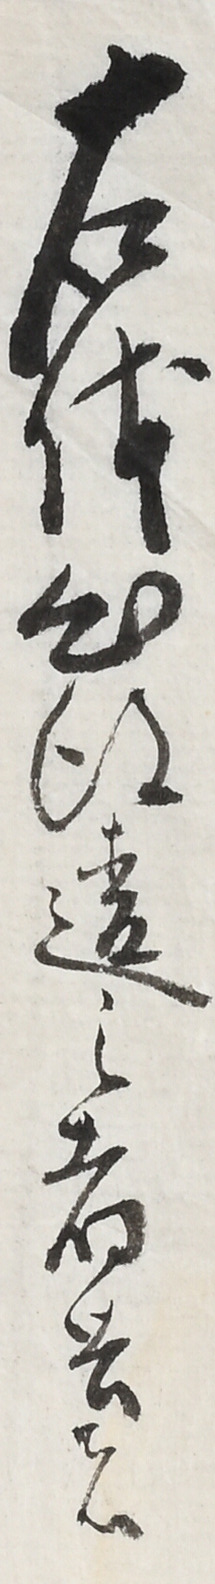右体心得違之者共者
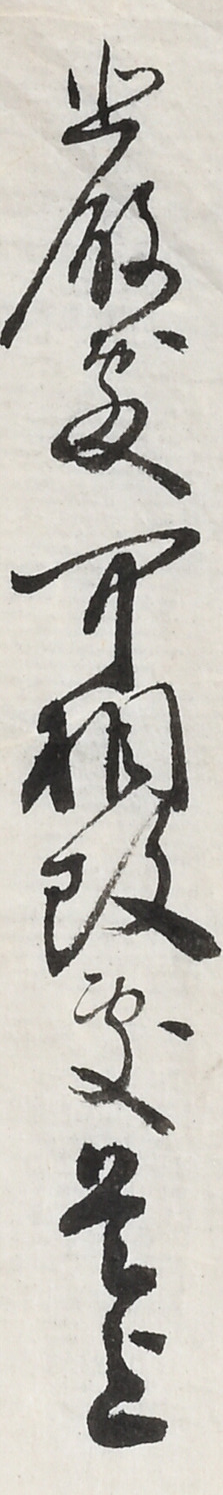厳敷可相改処是迄
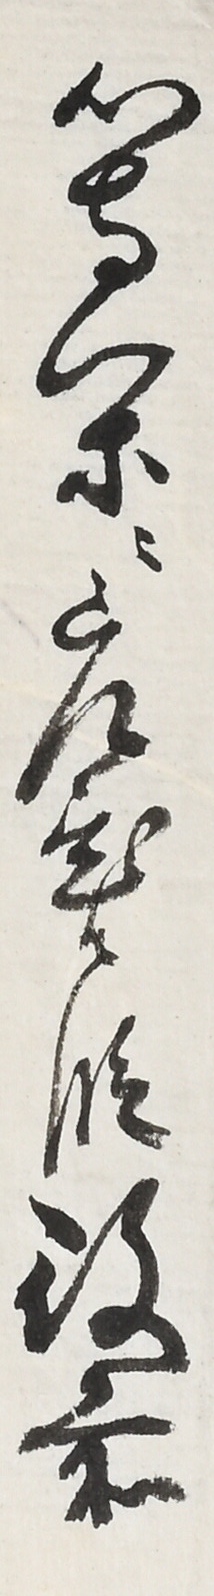等閑ニ差置候段役所
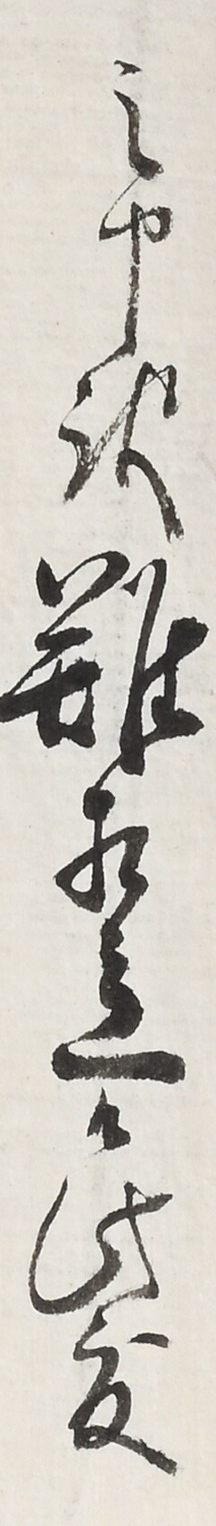之申訳難相立候此度
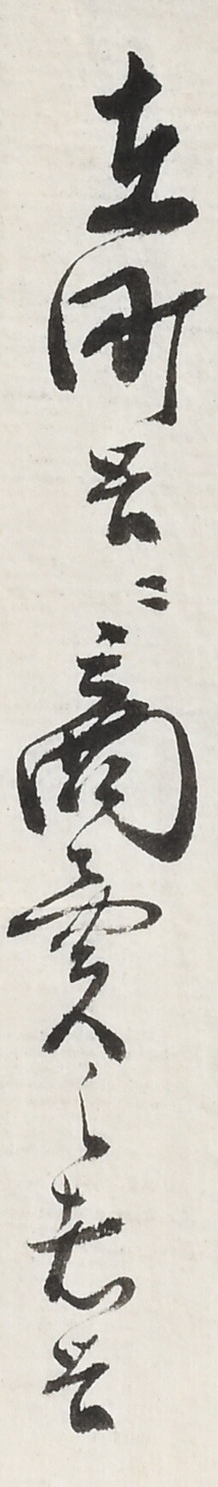在町共ニ商売之者共
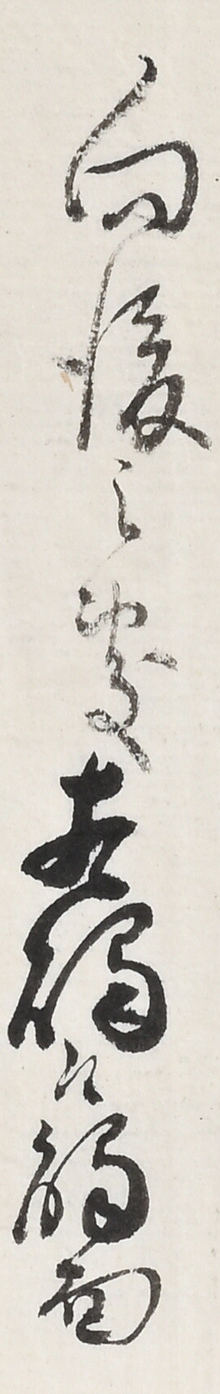向後之処相触候触面
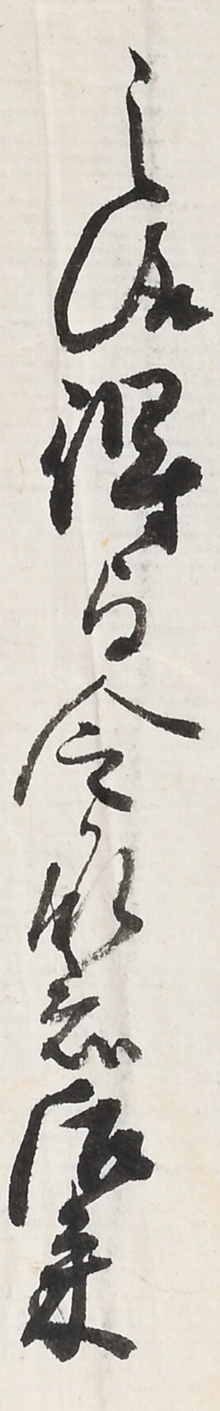之趣得与令承知后来
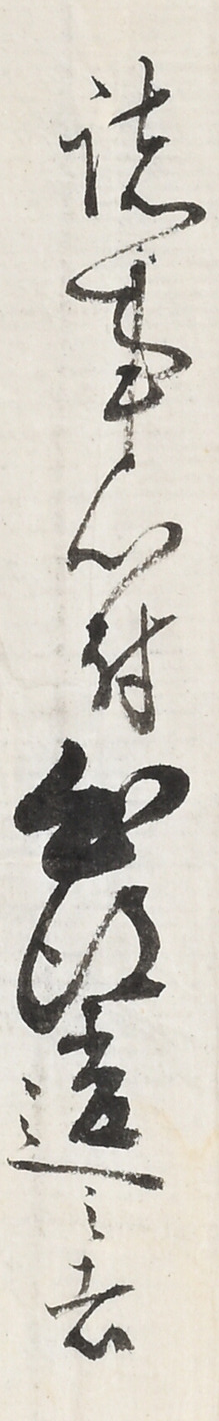諸事心付心得違之者
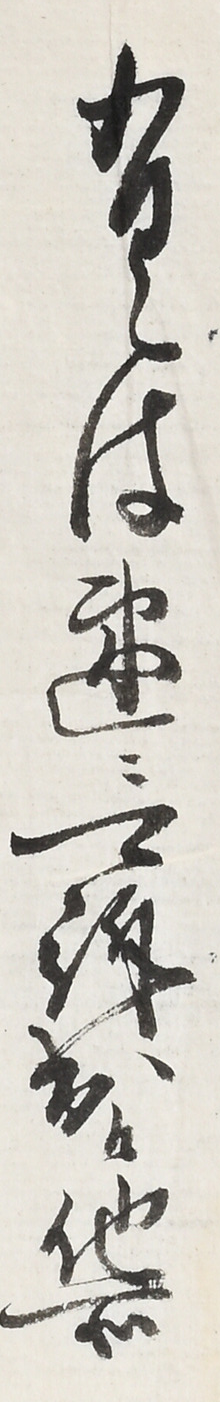有之は速ニ可訴出候他所
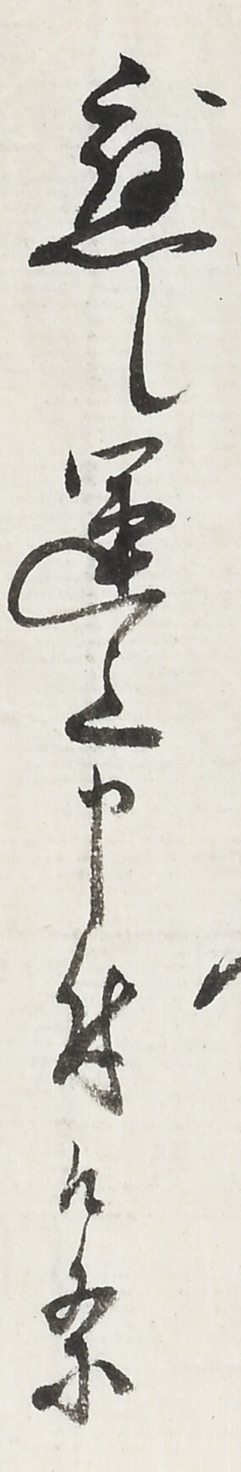応し運上申付候条
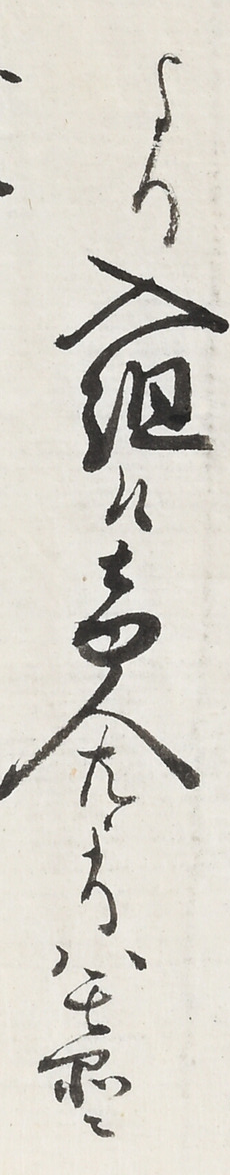より入組候商人共方ハ其品ニ
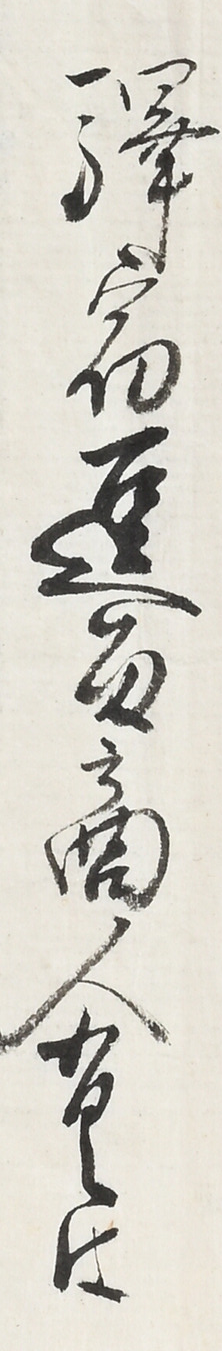駅宿逗留商人有之は
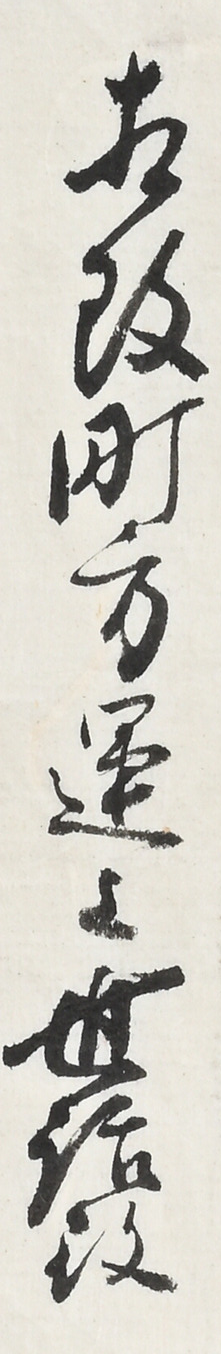相改町方運上世話役
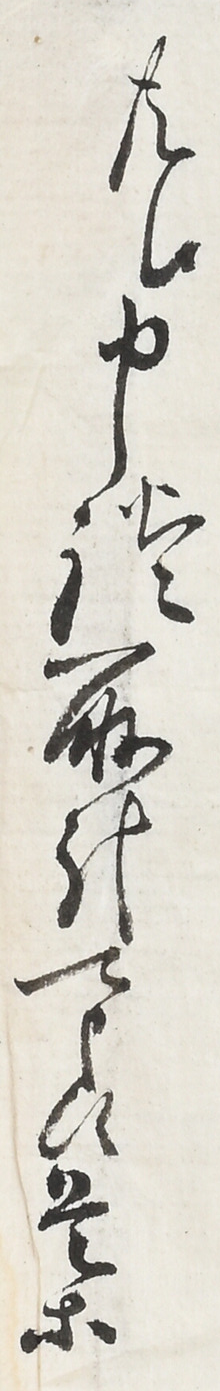共江申談取計可申候是等
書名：（書付）
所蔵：伊那市立高遠町図書館・合同会社AMANE
